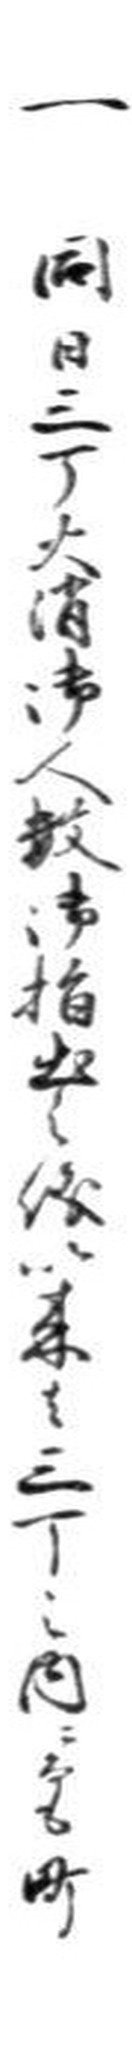一同日三丁火消御人数御指出之儀以来者三丁之内ニ而も町
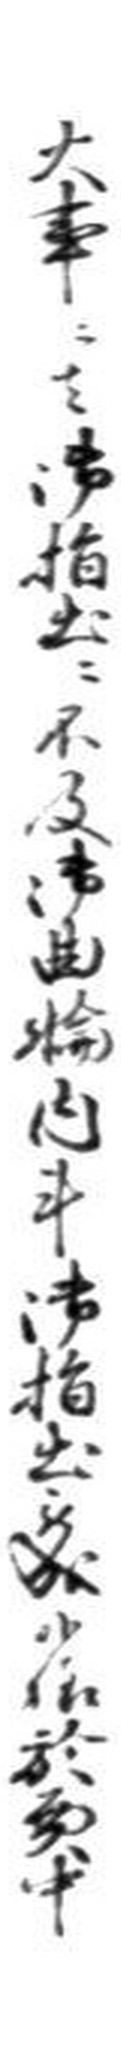火事ニ者御指出ニ不及御曲輪内斗御指出被成候様於殿中
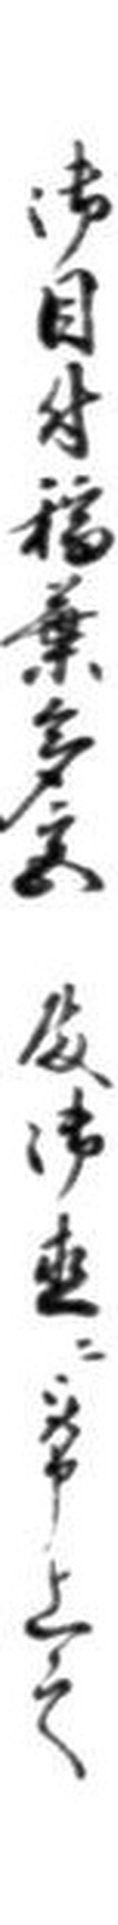御目付稲葉多宮殿御直ニ被申上之
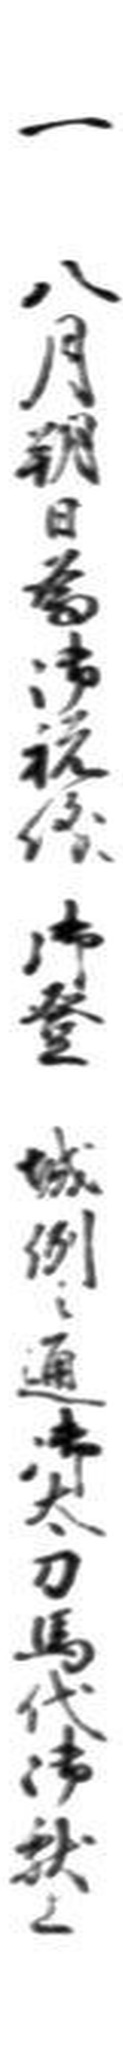一八月昨日為御祝儀御登城例之通御太刀馬代御献上
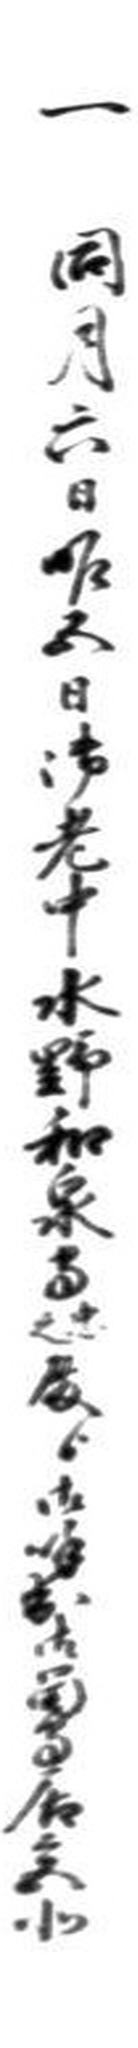一同月六日昨五日御老中水野和泉守忠之殿ゟ御呼出御留守居宮北
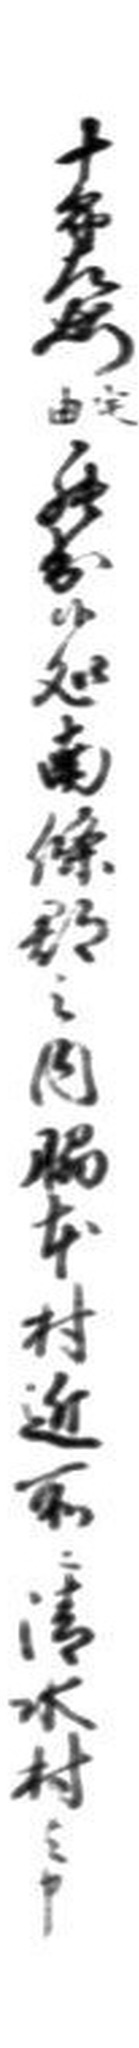十郎左衛門定由罷出候処南条郡之内脇本村近所ニ清水村与申
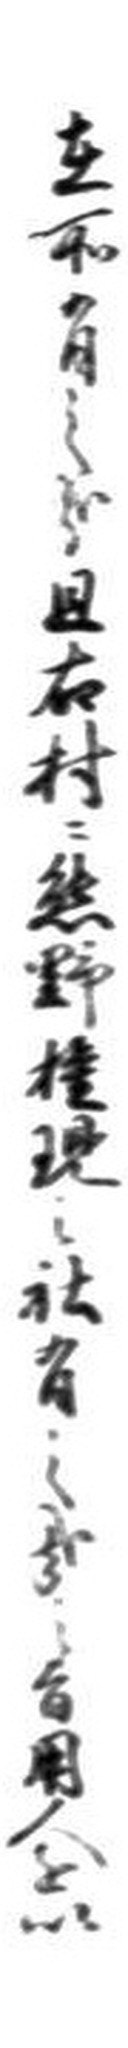在所有之哉且右村ニ熊野権現之社有之哉之旨用人を以
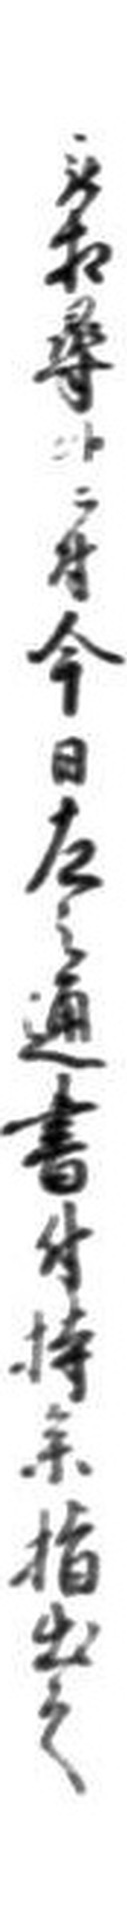被相尋候ニ付今日左之通書付持参指出之
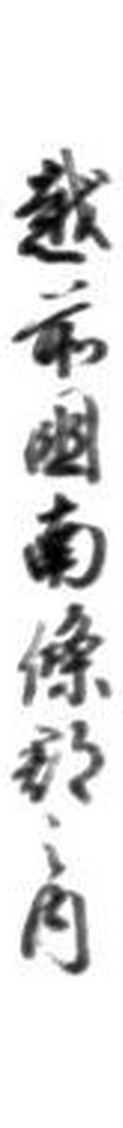越前国南条郡之内
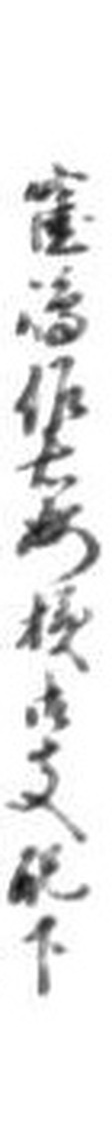窪嶋作右衛門様御支配下
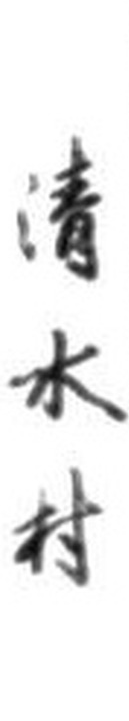清水村
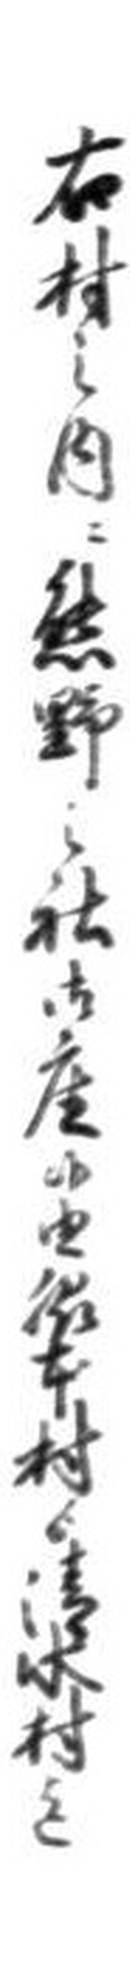右村之内ニ熊野之社御座候由脇本村ゟ清水村迄
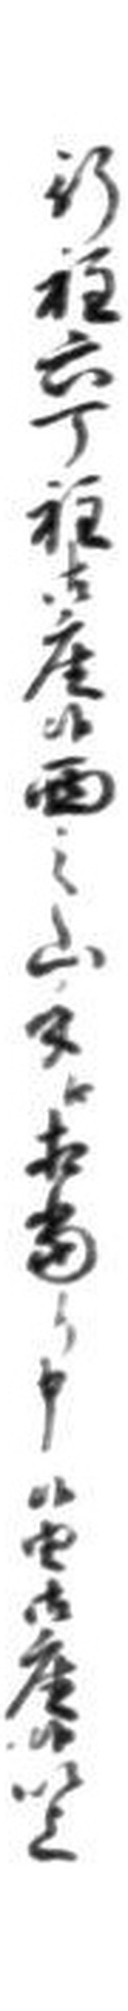行程六丁程御座候西之山手江相当り申候由御座候以上

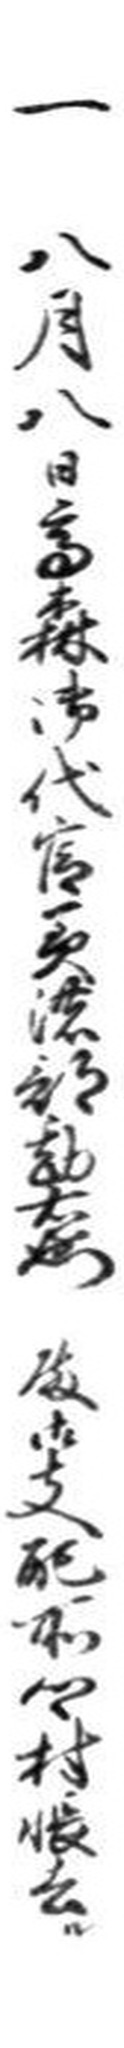一八月八日高森御代官美濃部勘右エ門殿御支配所郷村帳去ル
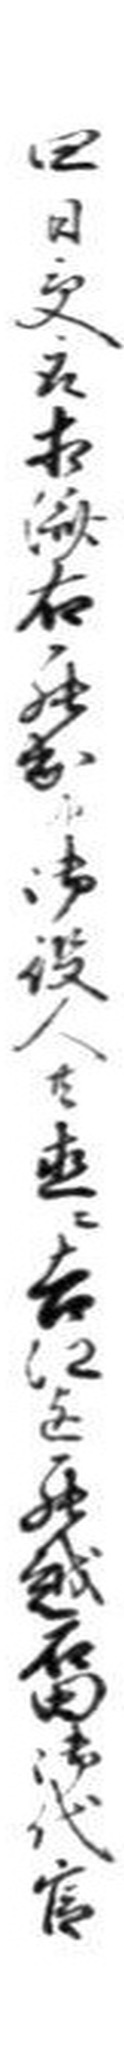四日受取相済右罷出候御役人共直ニ吉江迄罷越石田御代官
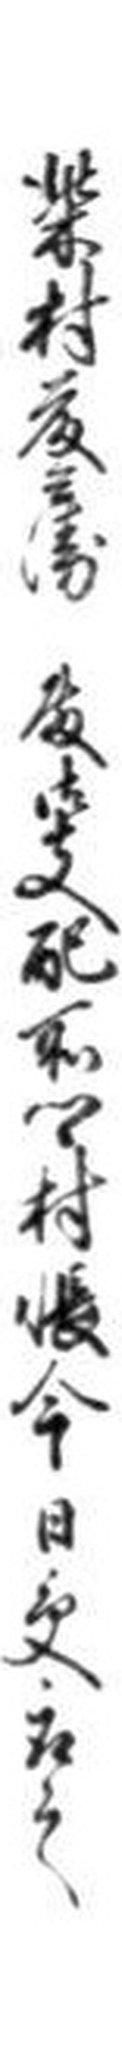柴村藤兵衛殿御支配所郷村帳今日受取之
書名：家譜 三十四 吉邦公 従享保五年到同六年
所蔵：福井県文書館 Fukui Prefectural Archives
